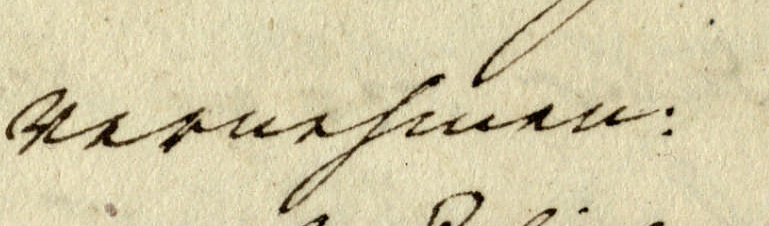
vernehmen:
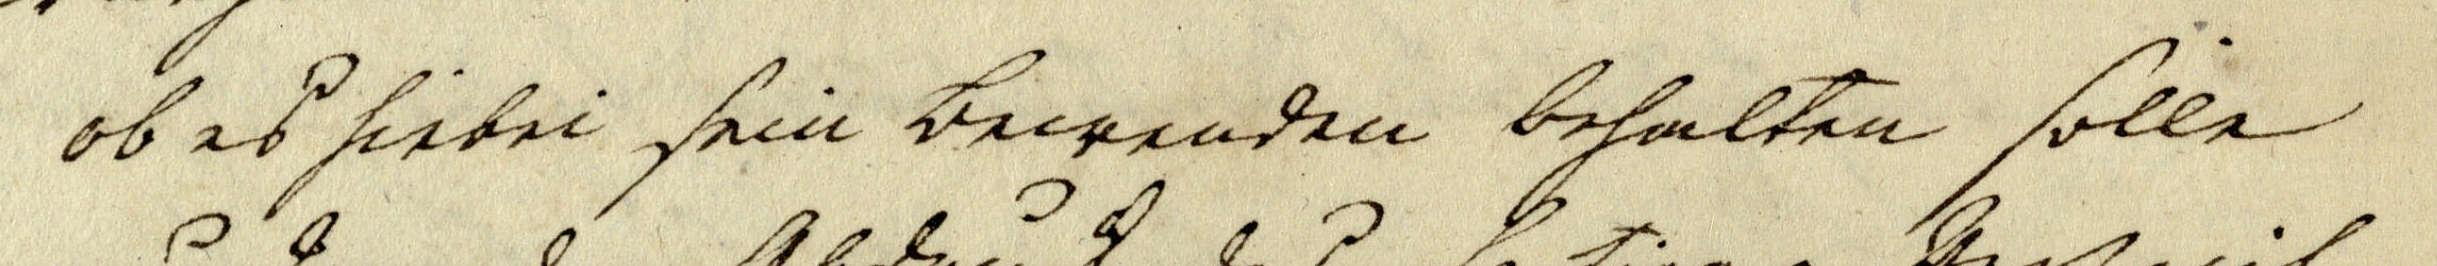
ob es hiebei sein Bewenden behalten solle
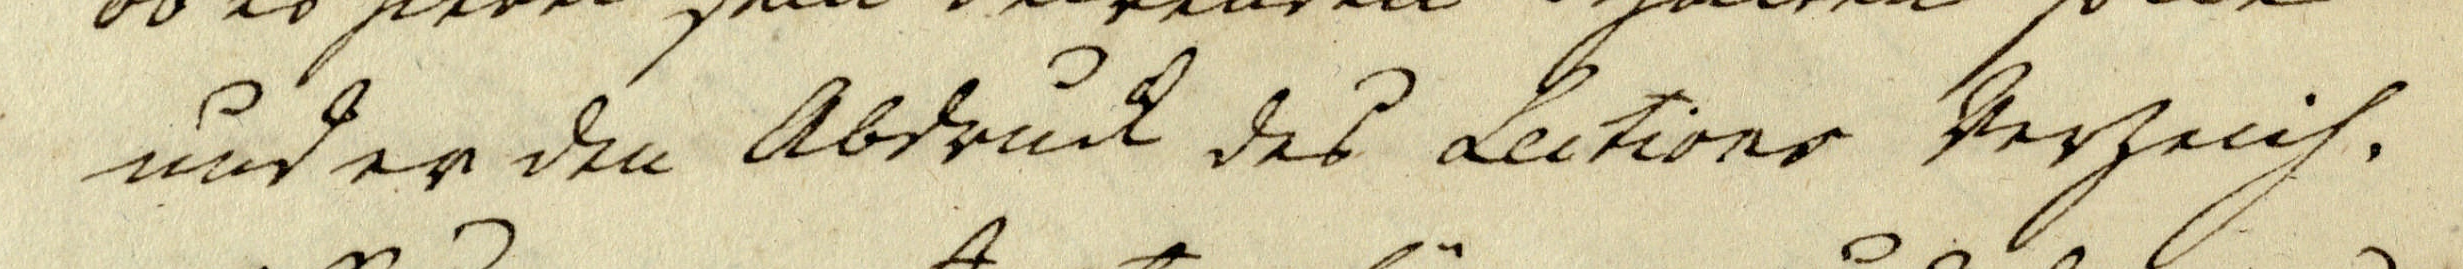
und er den Abdruck des Lections Verzeich¬
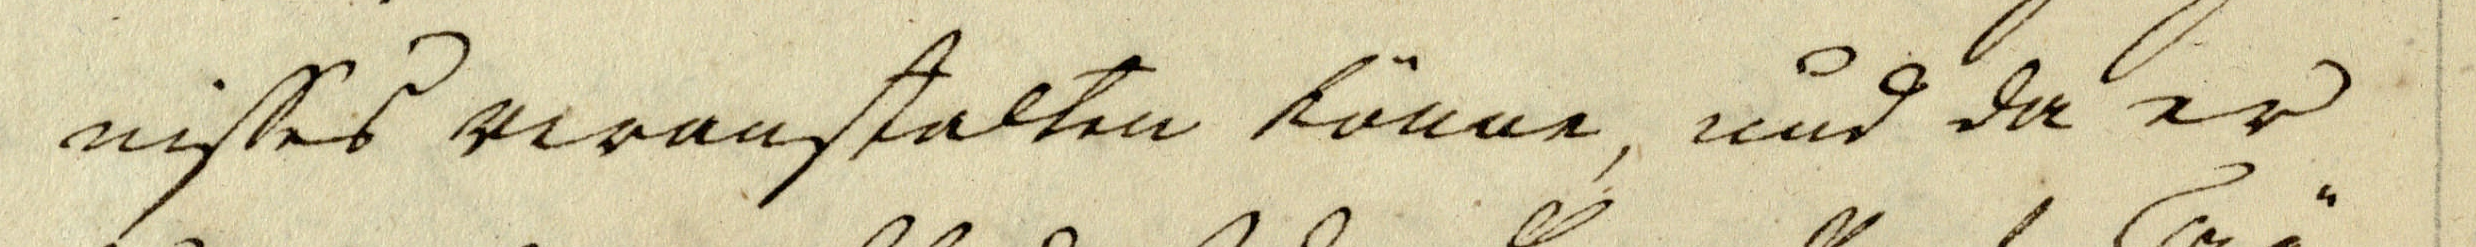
nisses veranstalten könne, und da er
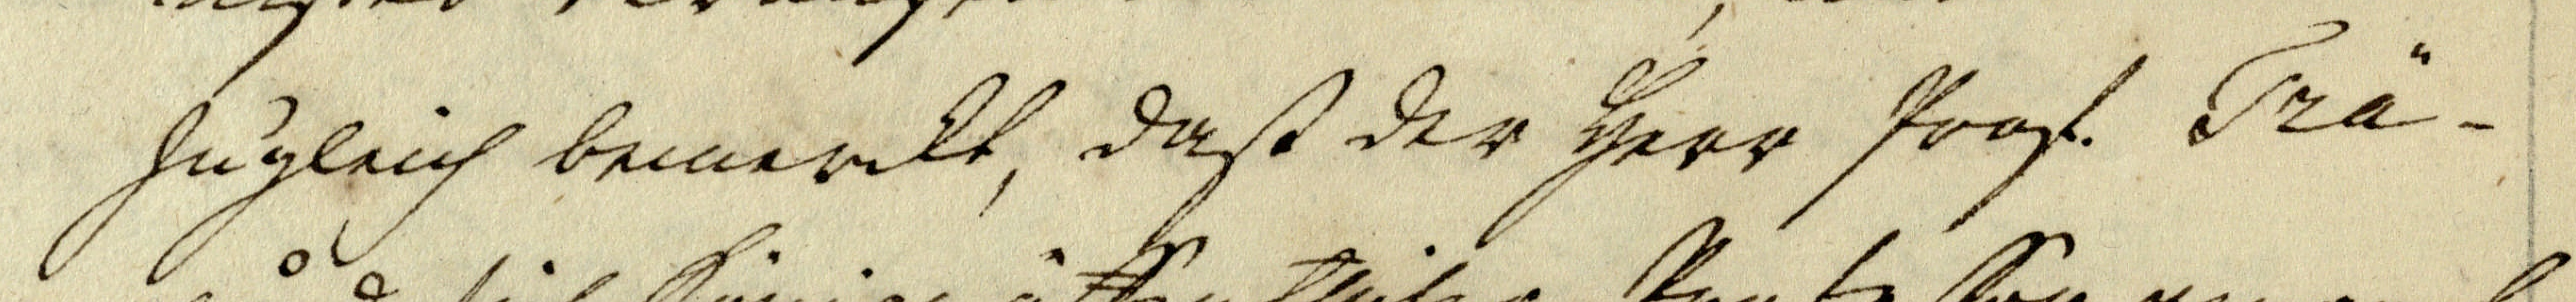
zugleich bemerckt, daß der Herr Prof. Trä¬
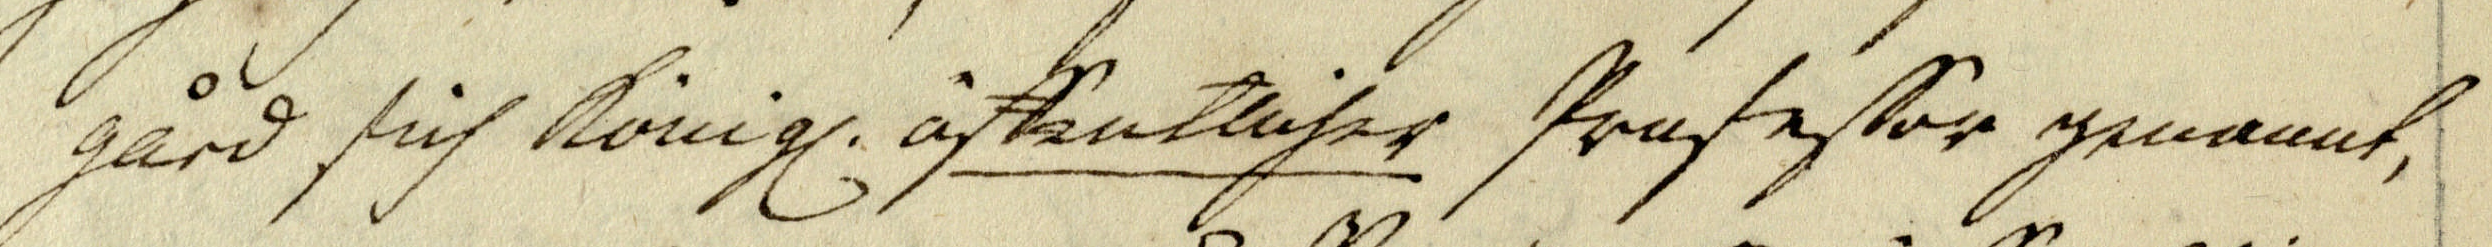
gård sich Königl. öffentlicher Professor genannt,
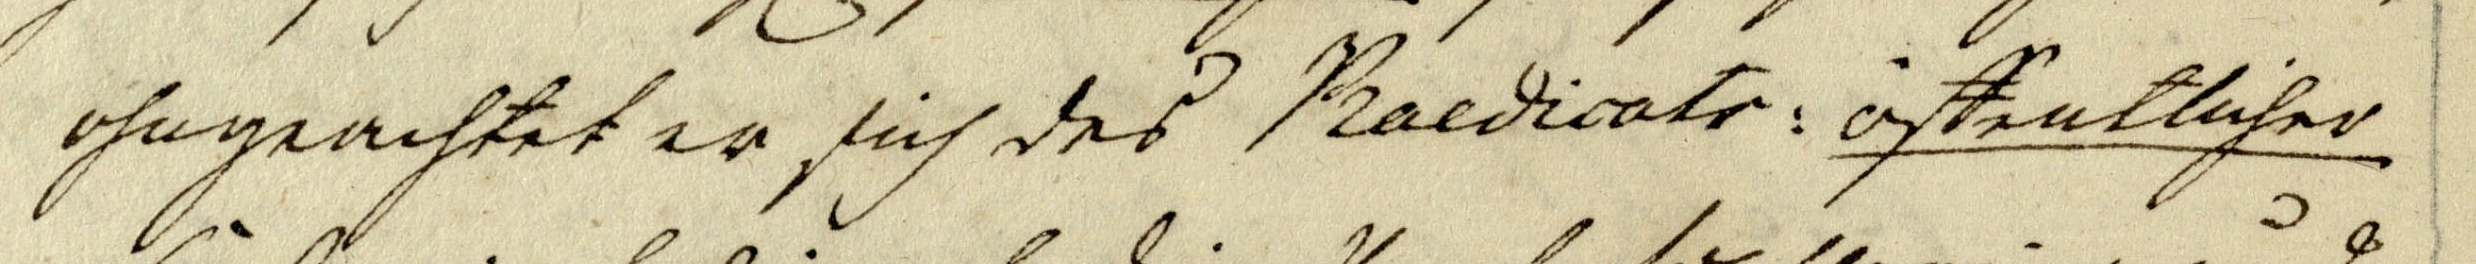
ohngeachtet er sich des Praedicats: öffentlicher
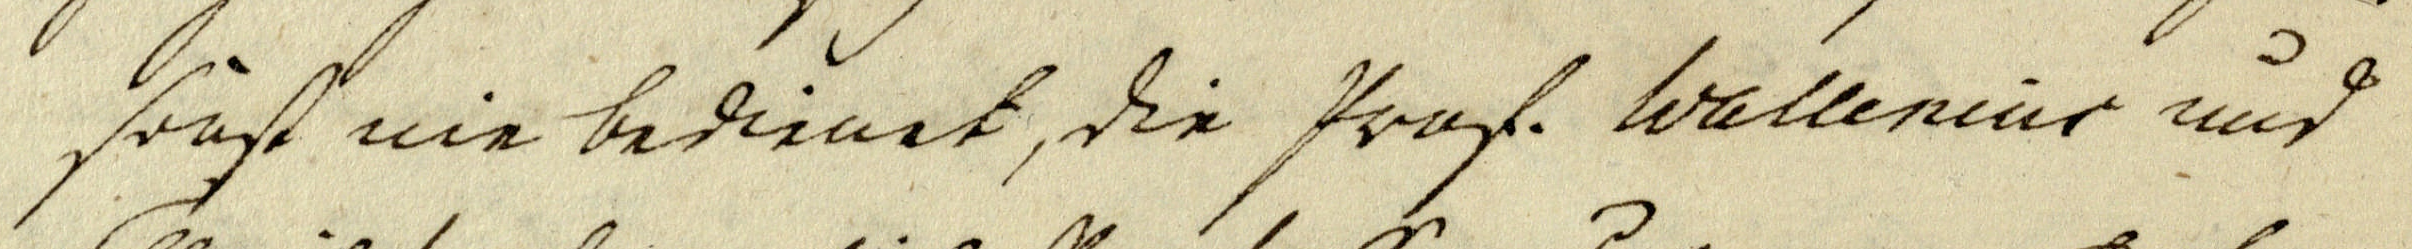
sonst nie bedienet, die Prof. Wallenius und
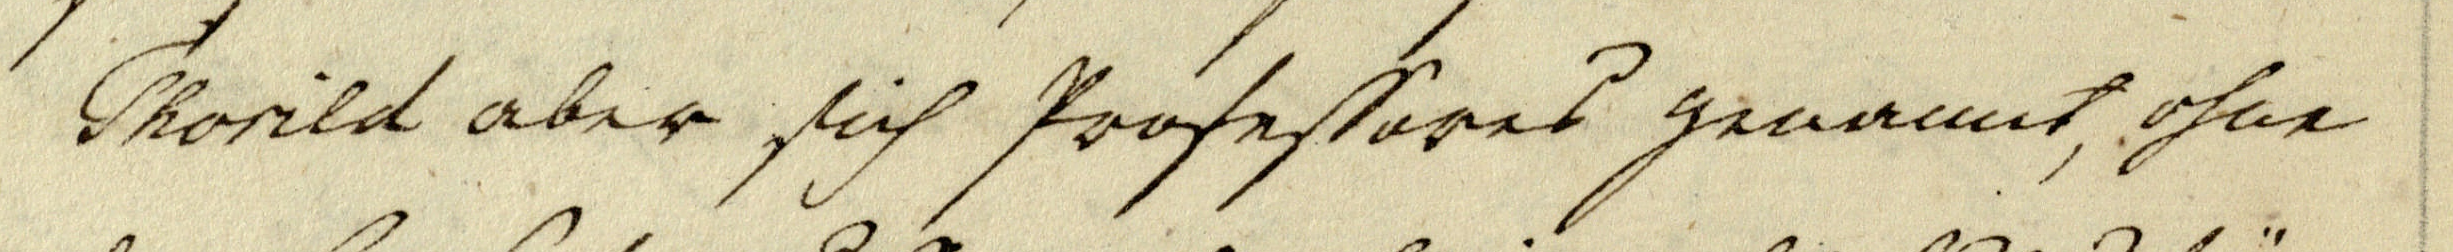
Thorild aber sich Professores genannt, ohne
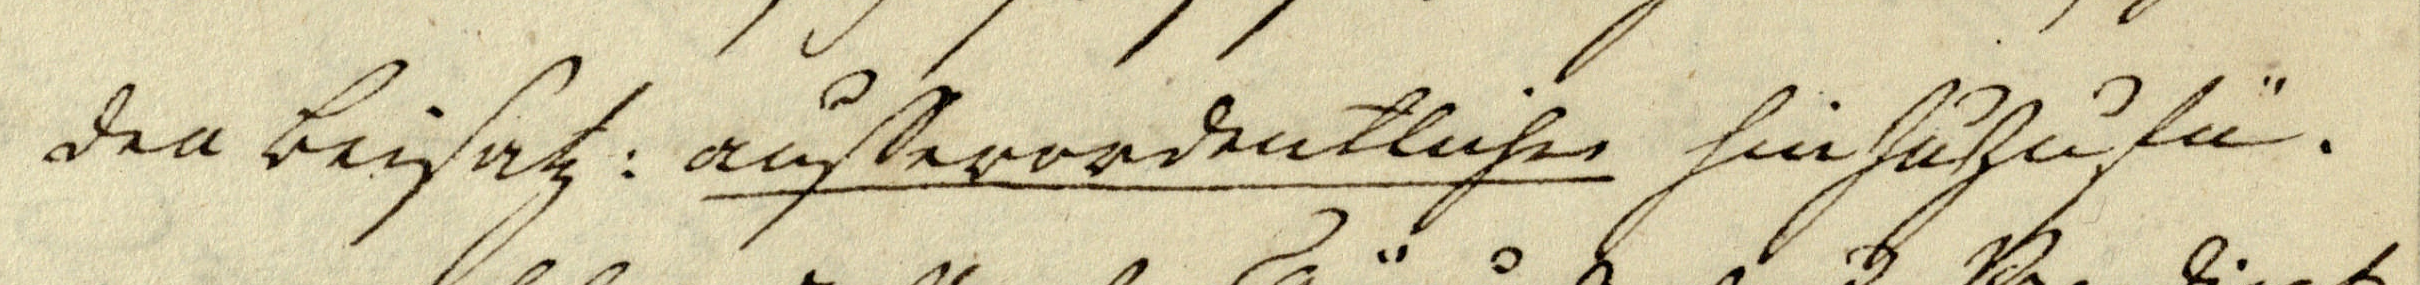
den Beisatz außerordentlicher hinzuzufü¬
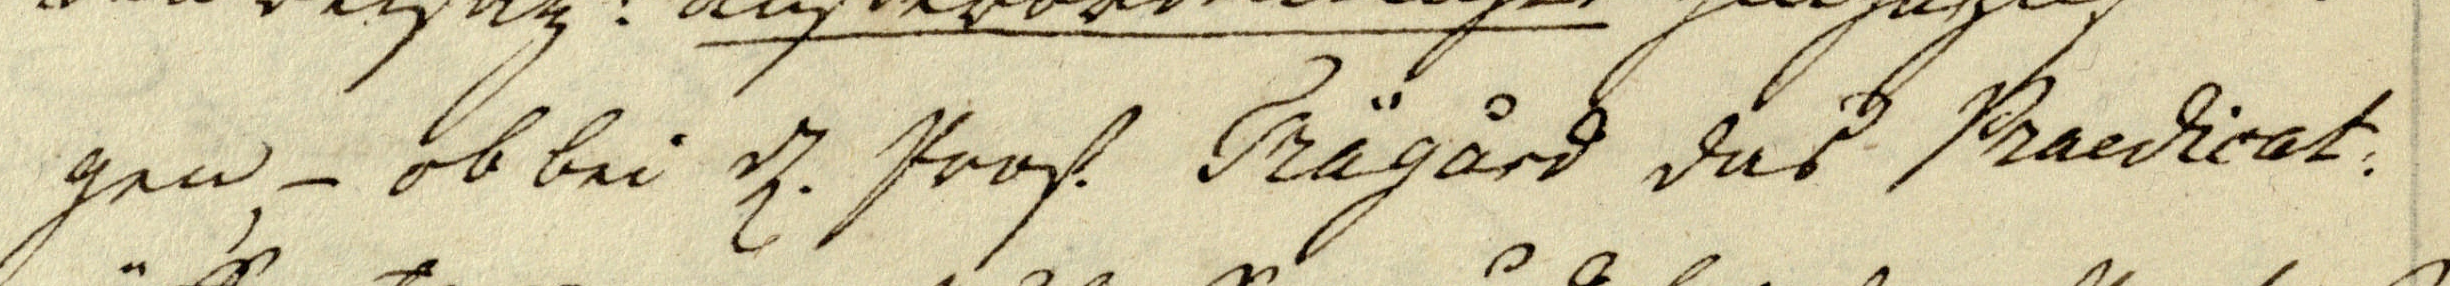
gen - ob bei dh. Prof. Trägård das Praedicat
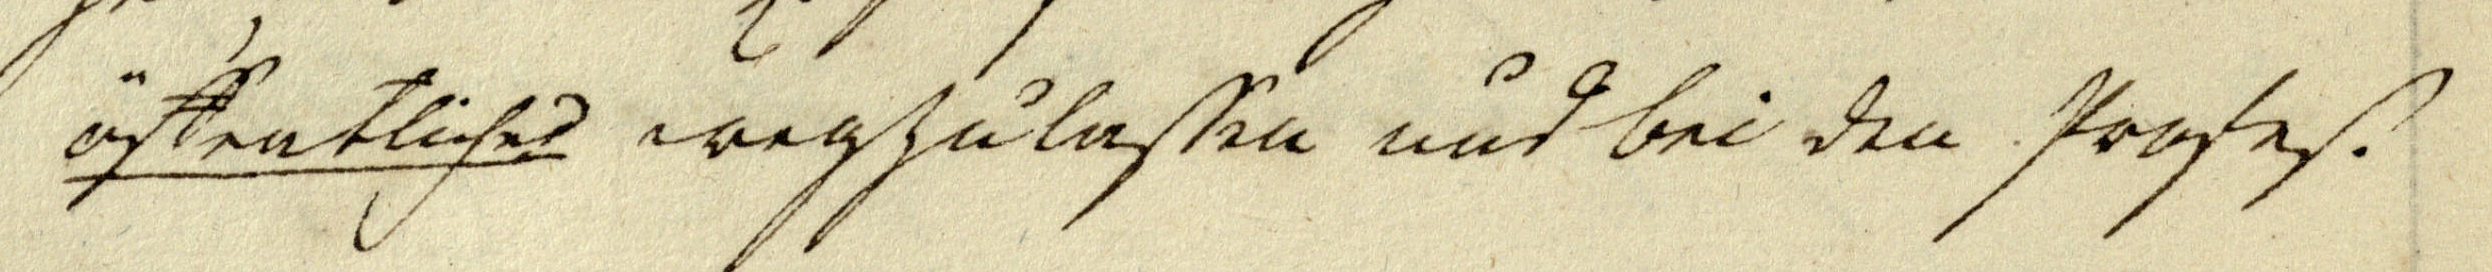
öffentlicher wegzulassen und bei den Profes¬
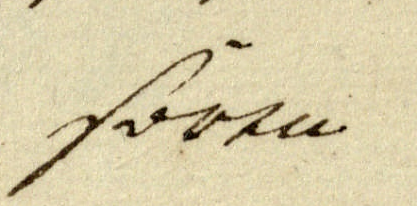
soren
